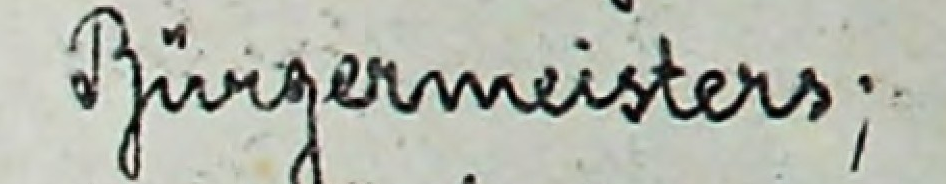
Bürgermeisters;
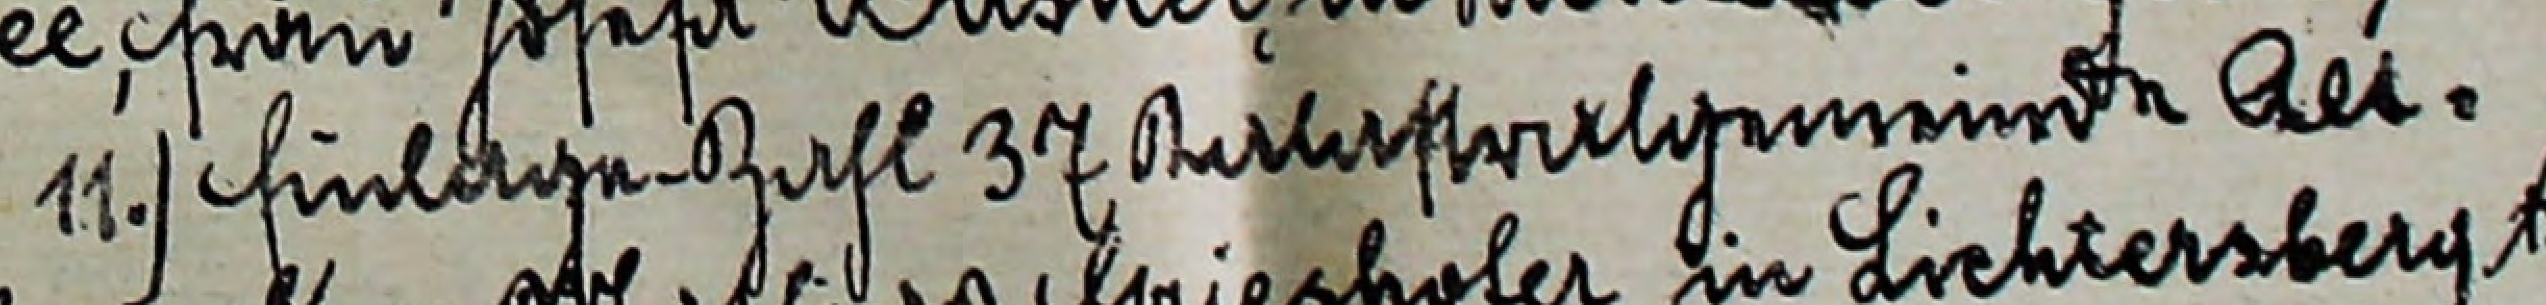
11.) Einlage - Zahl 37 Katastralgemeinde Alt=
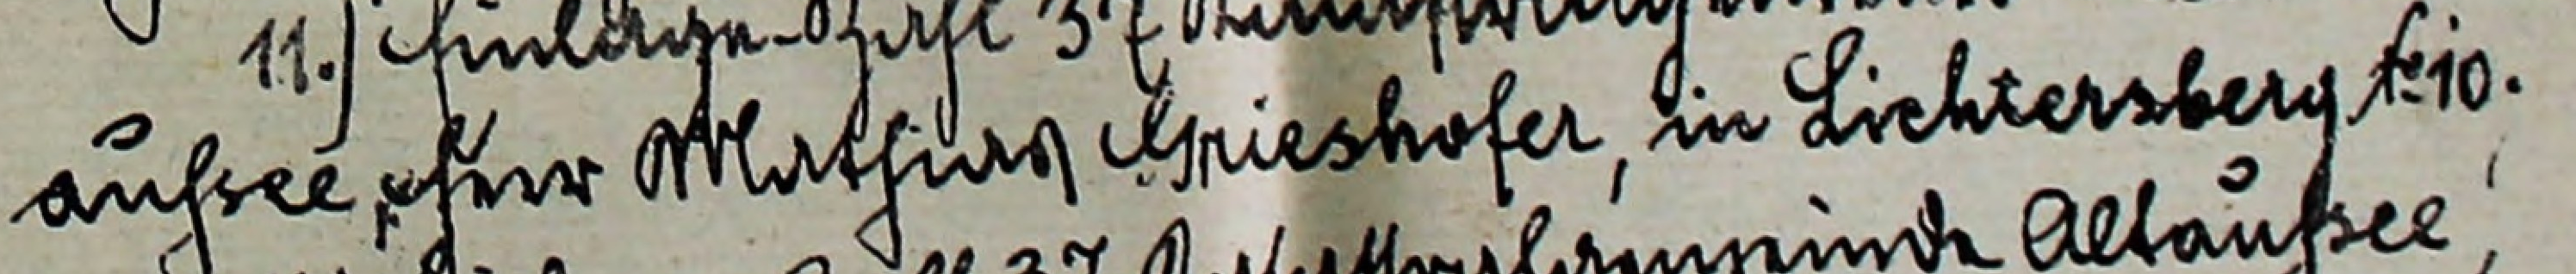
aussee, Herr Mathias Grieshofer, in Lichtersberg No 10;
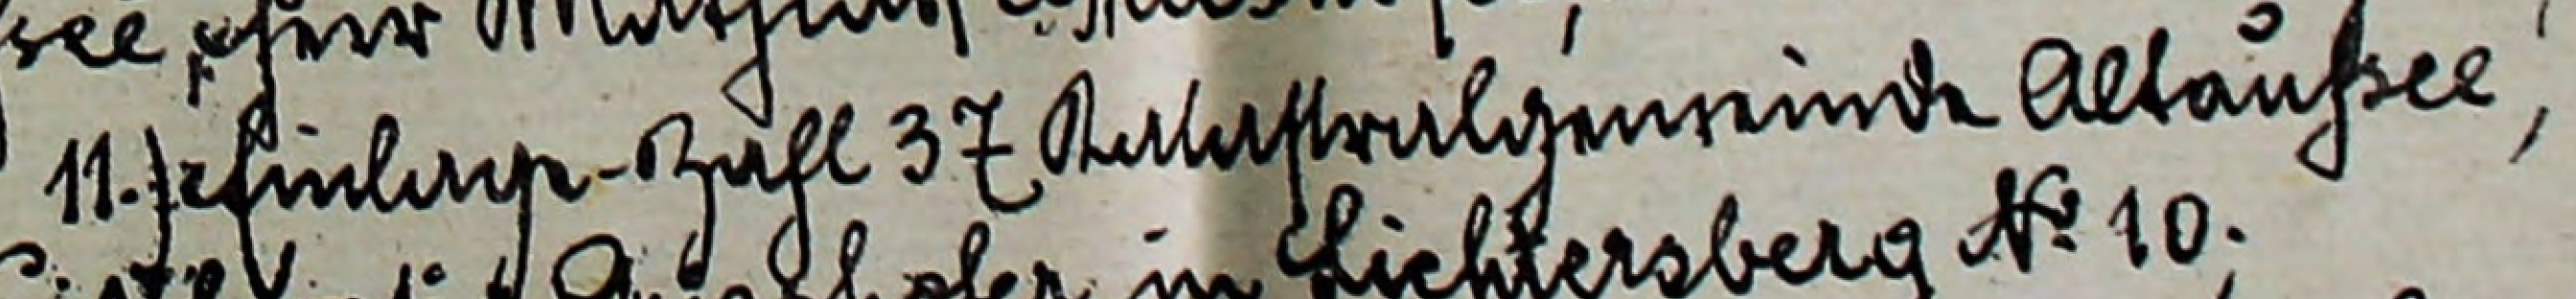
11.) Einlage - Zahl 37 Katastralgemeinde Altaussee,
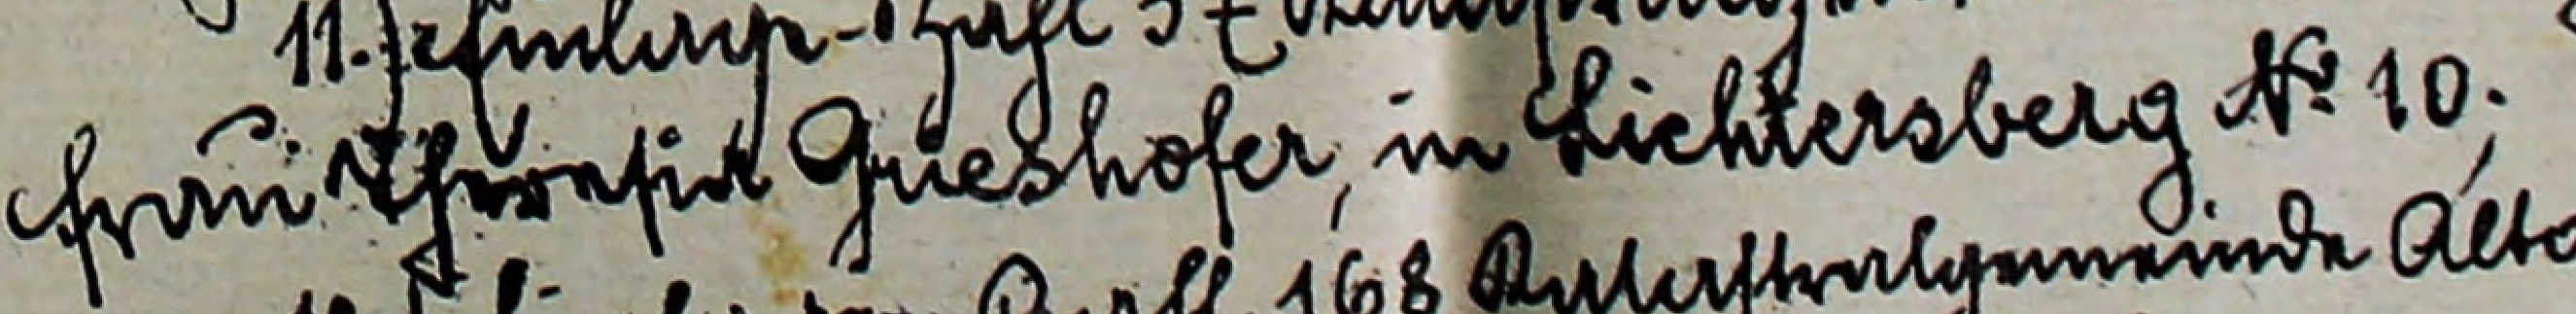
Frau Theresia Grieshofer, in Lichtersberg No 10;
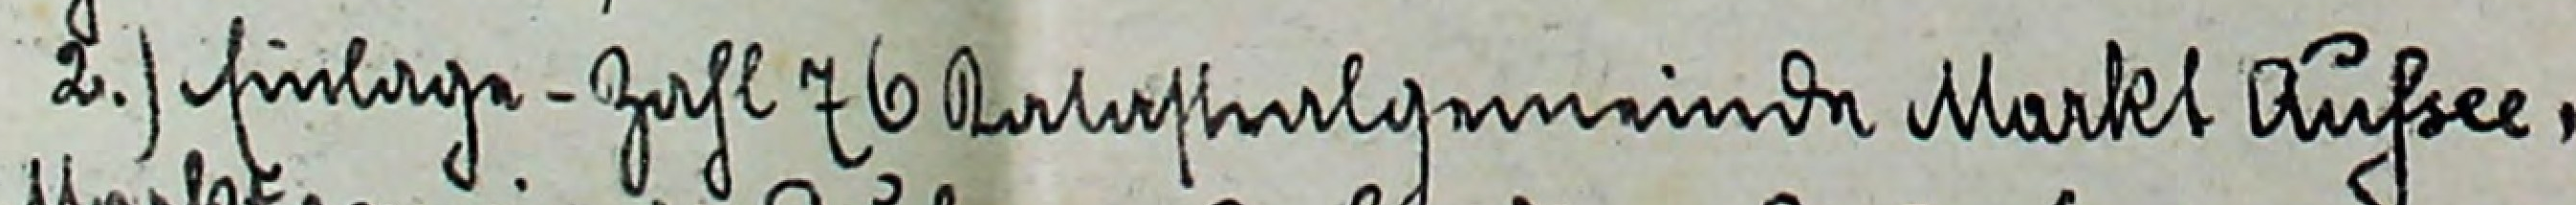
2.) Einlage - Zahl 76 Katastralgemeinde Markt Aussee,
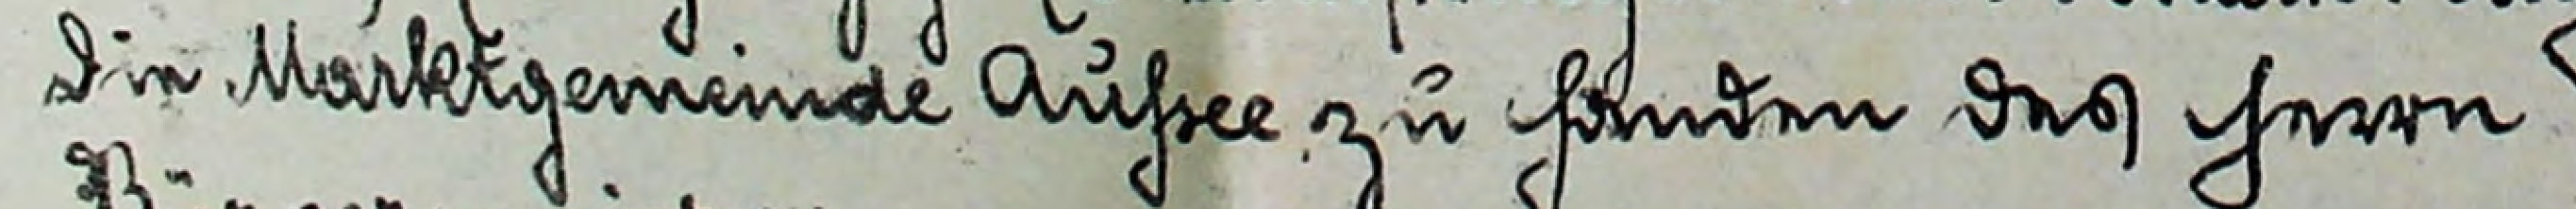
Die Marktgemeinde Aussee zu Handen des Herrn
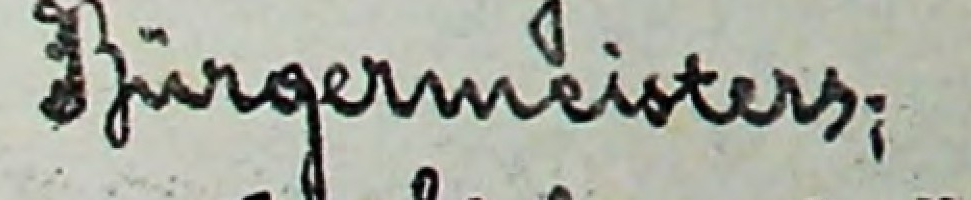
Bürgermeisters;
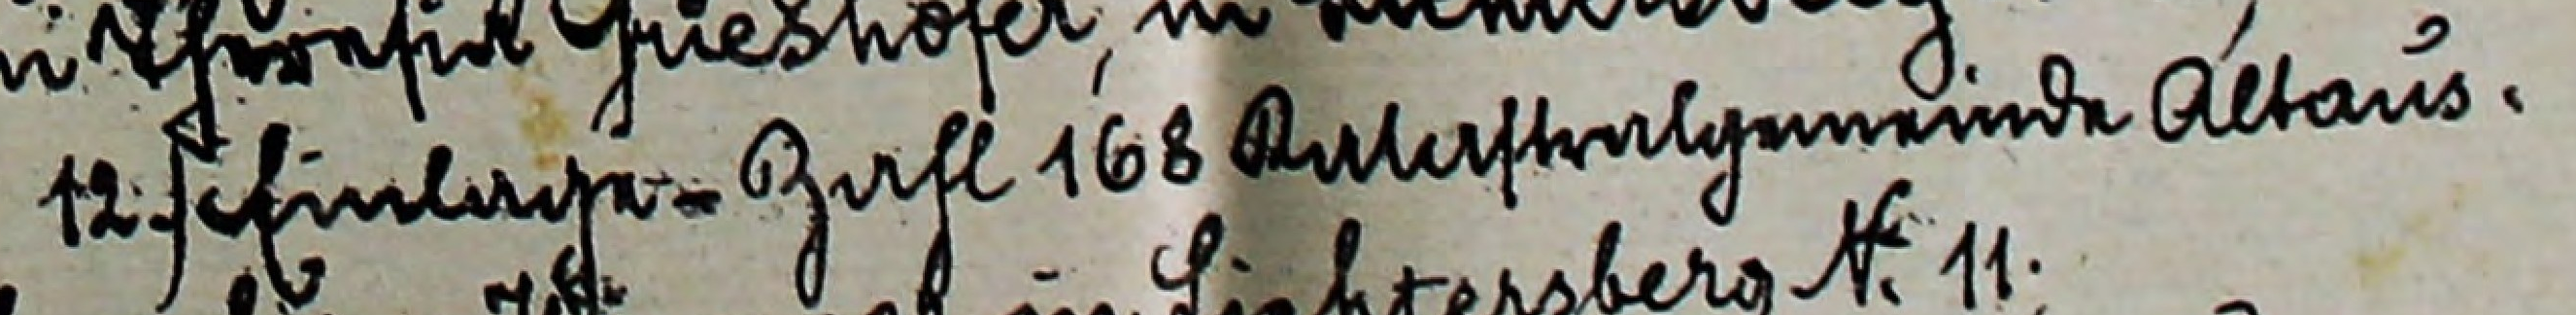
12.) Einlage - Zahl 168 Katastralgemeinde Altaus=
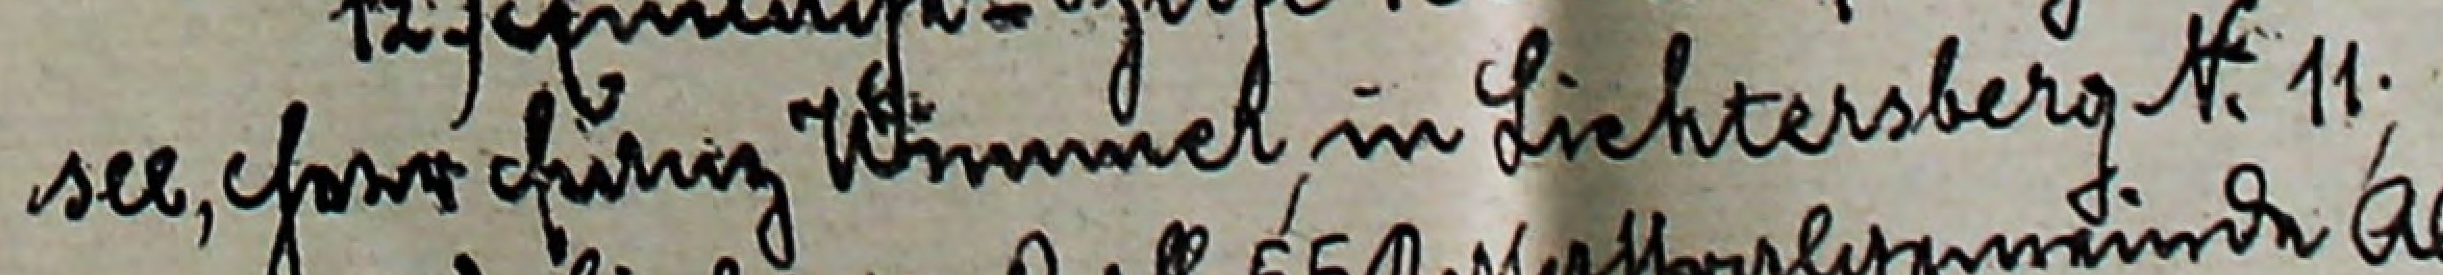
see, Herr Franz Wimmer, in Lichtersberg No 11.
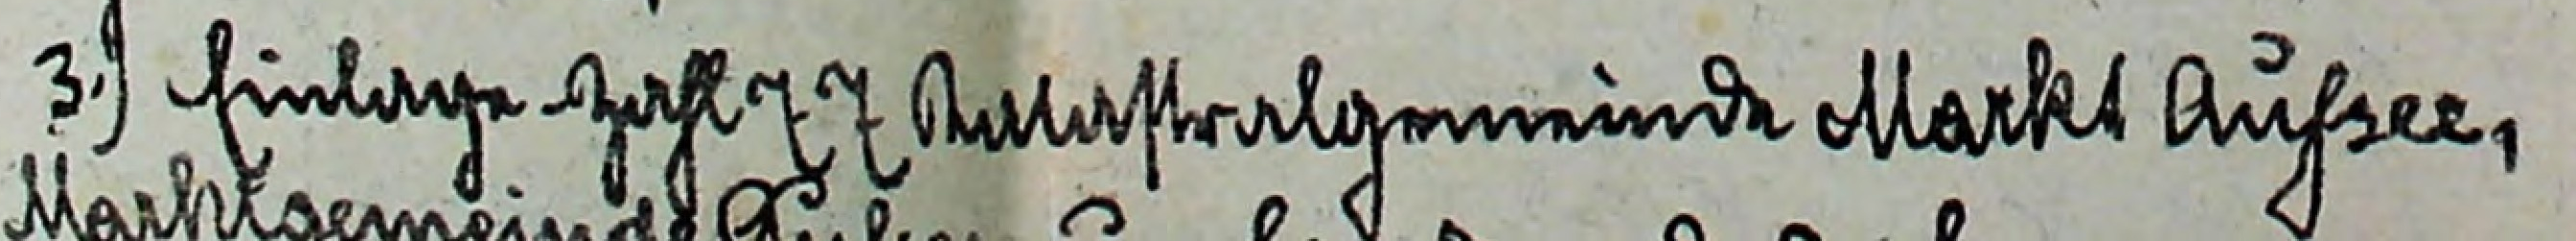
3.) Einlage - Zahl 77 Katastralgemeinde Markt Aussee,
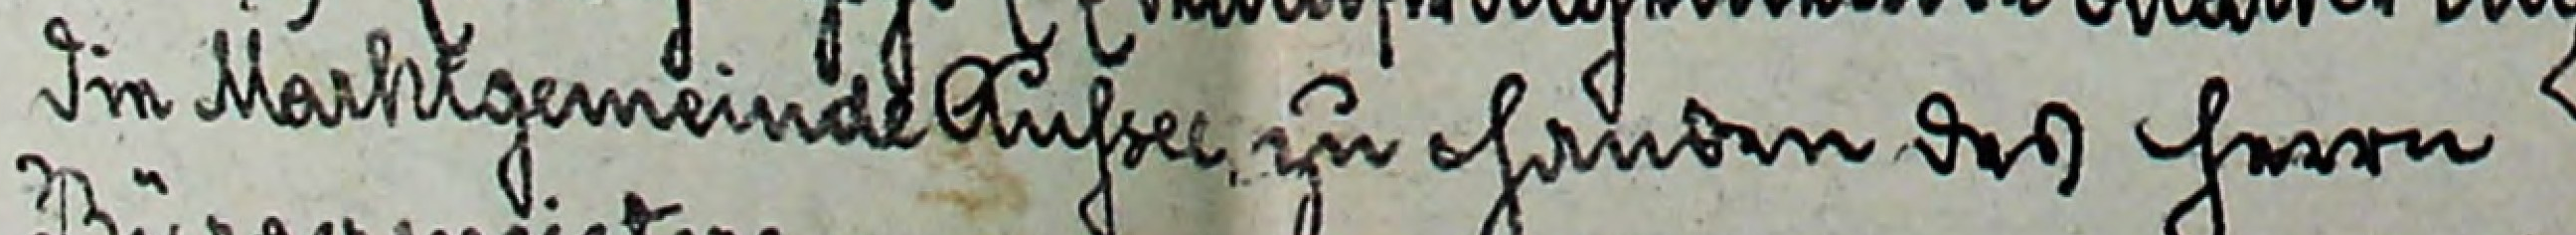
Die Marktgemeinde Aussee zu Handen des Herrn
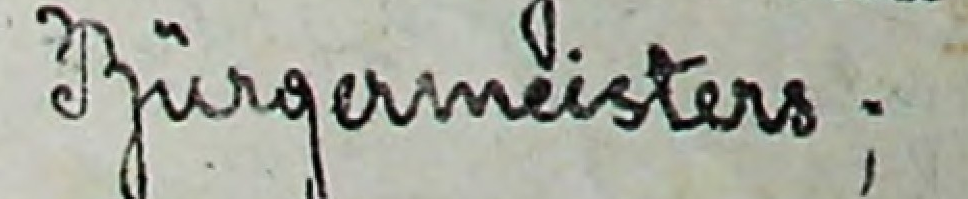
Bürgermeisters;
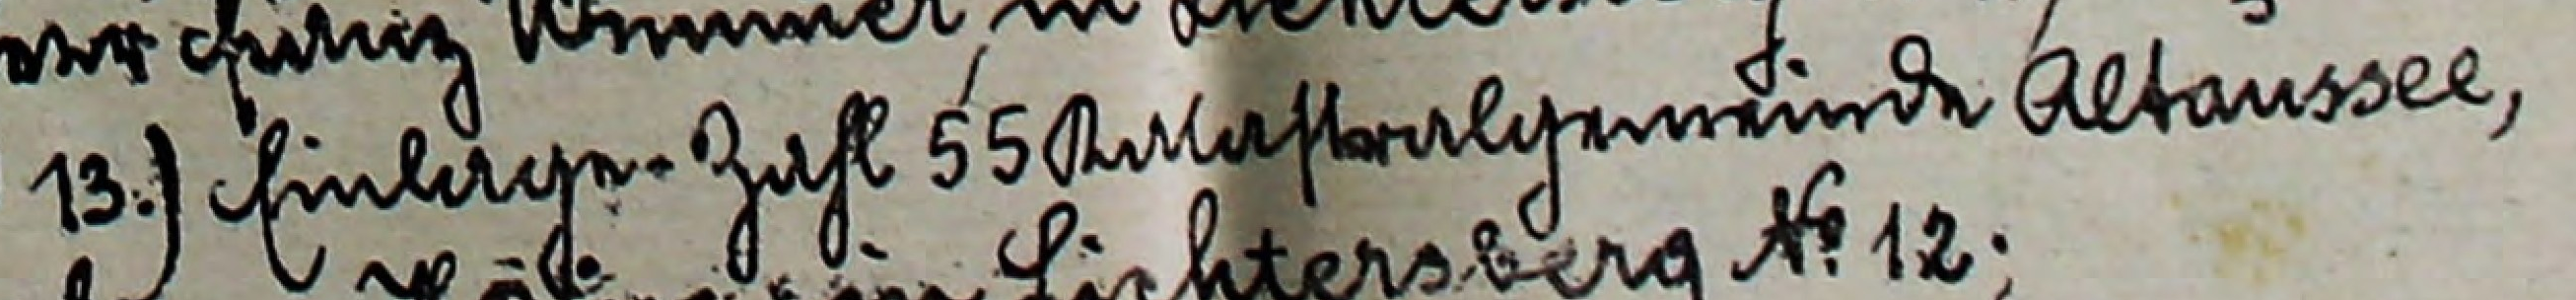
13.) Einlage - Zahl 55 Katastralgemeinde Altaussee,
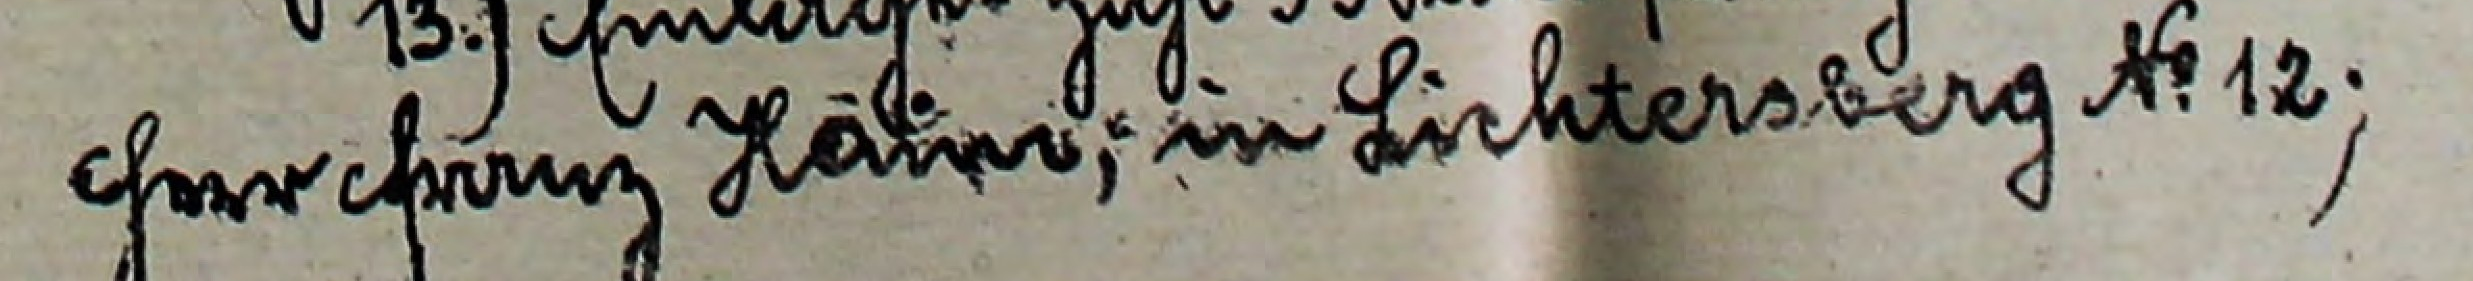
Herr Franz Kain, in Lichtersberg No 12;
